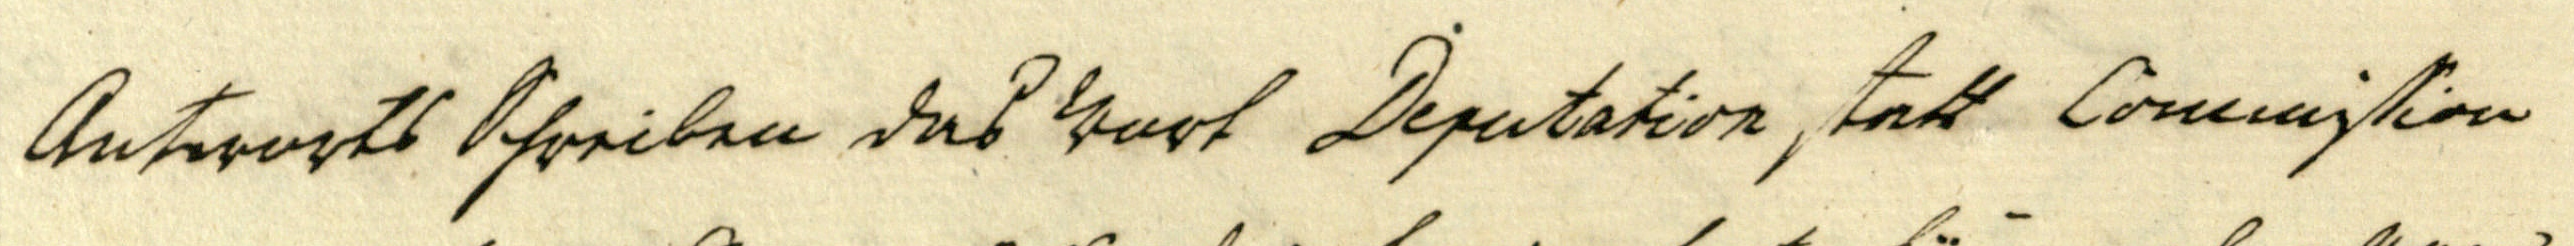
Antworts Schreiben das Wort Deputation, statt Commission
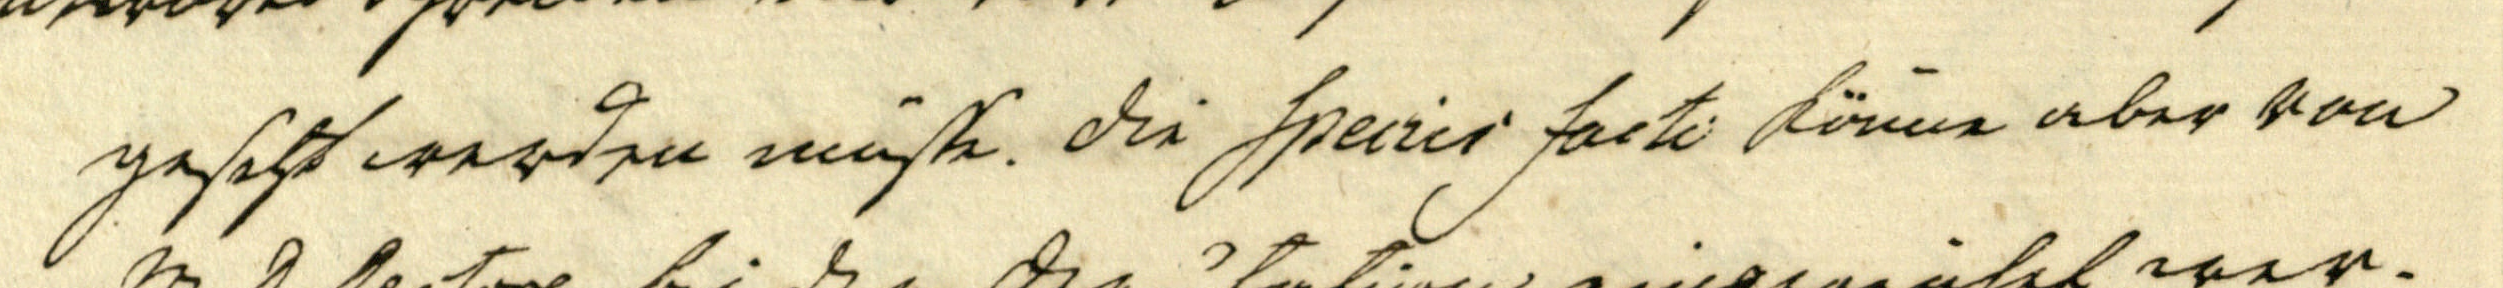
gesetzt werden müsse. Die species Facti könne aber von
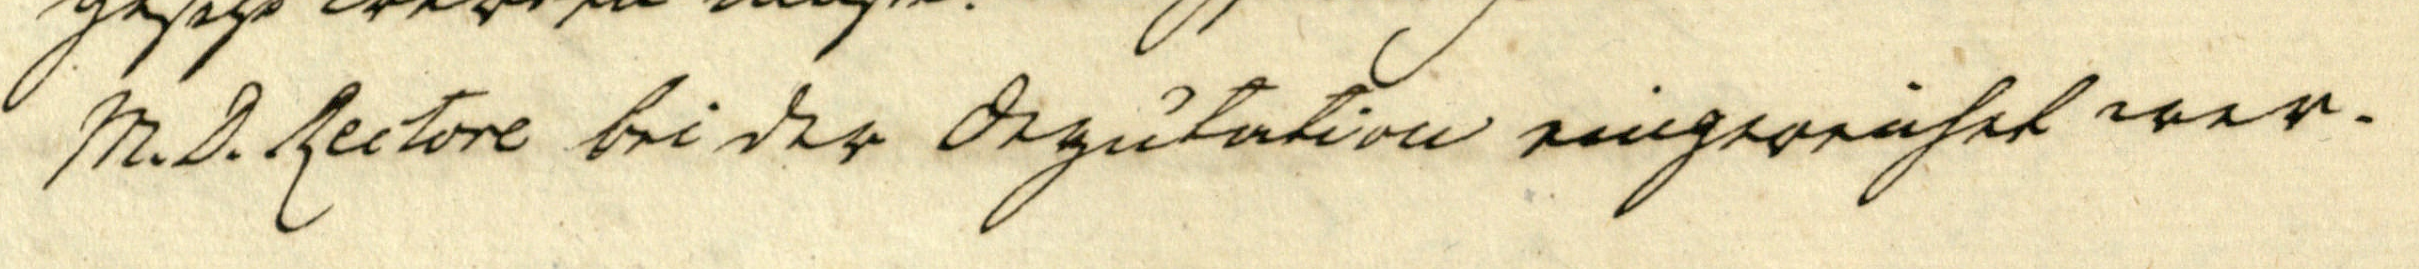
M. D. Rectore bei der Deputation eingereichet wer¬
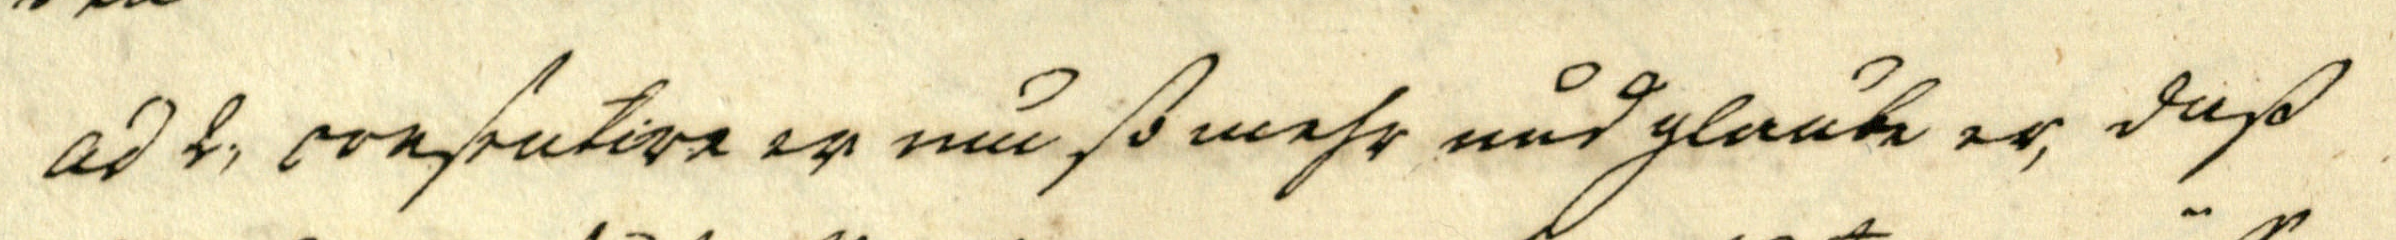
ad 2., consentire er um so mehr und glaube er, daß
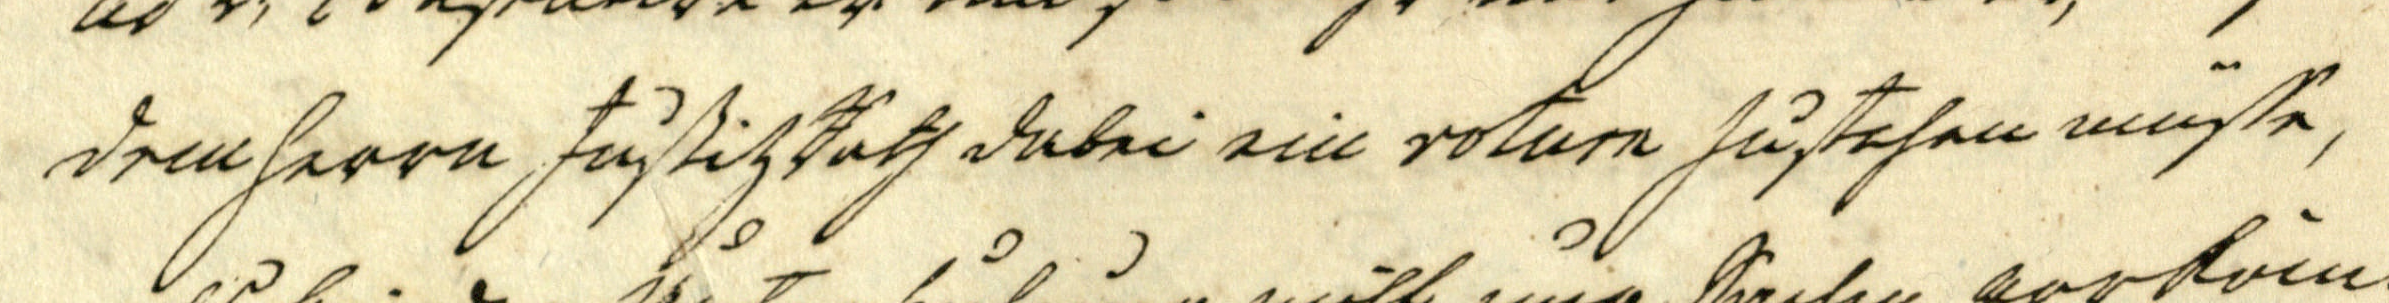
dem Herrn Justiz Rath dabei ein votum zustehen müsse,
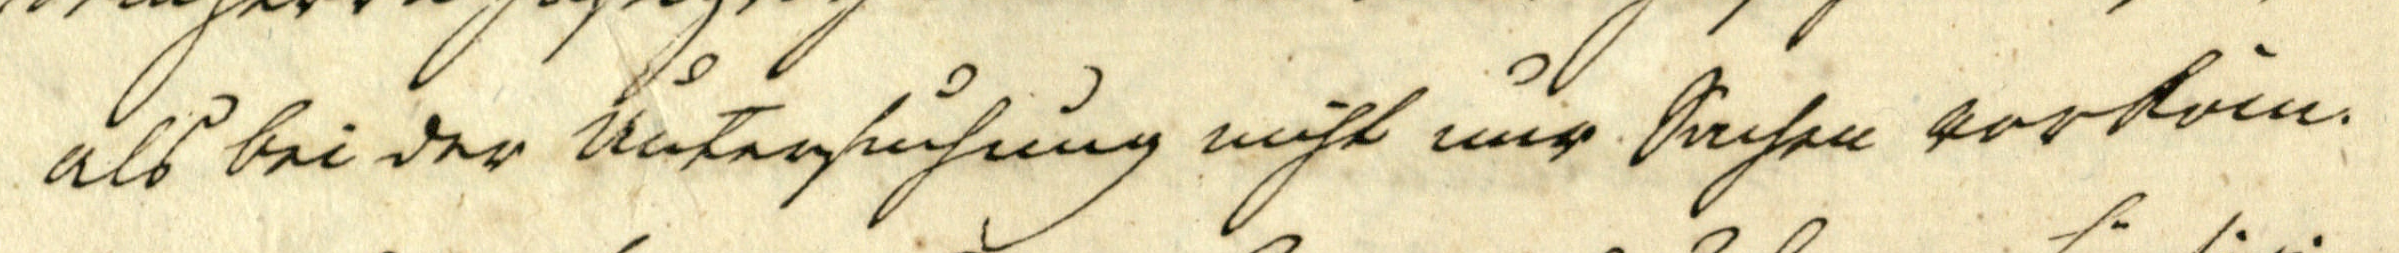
als bei der Untersuchung nicht nur Sachen vorkom¬
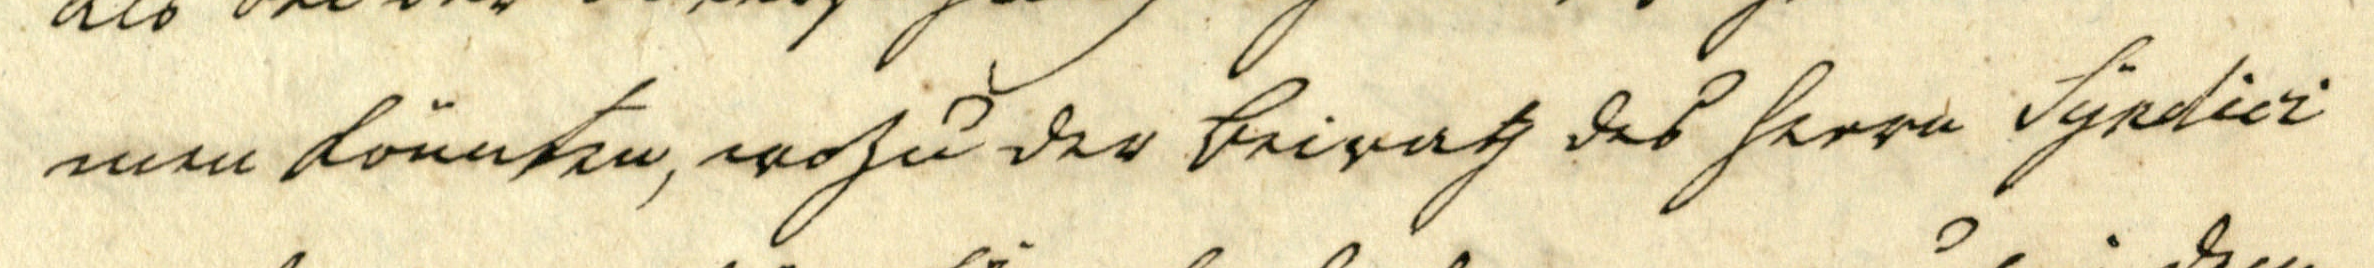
men könnten, wozu der Beirath des Herrn Sÿndici
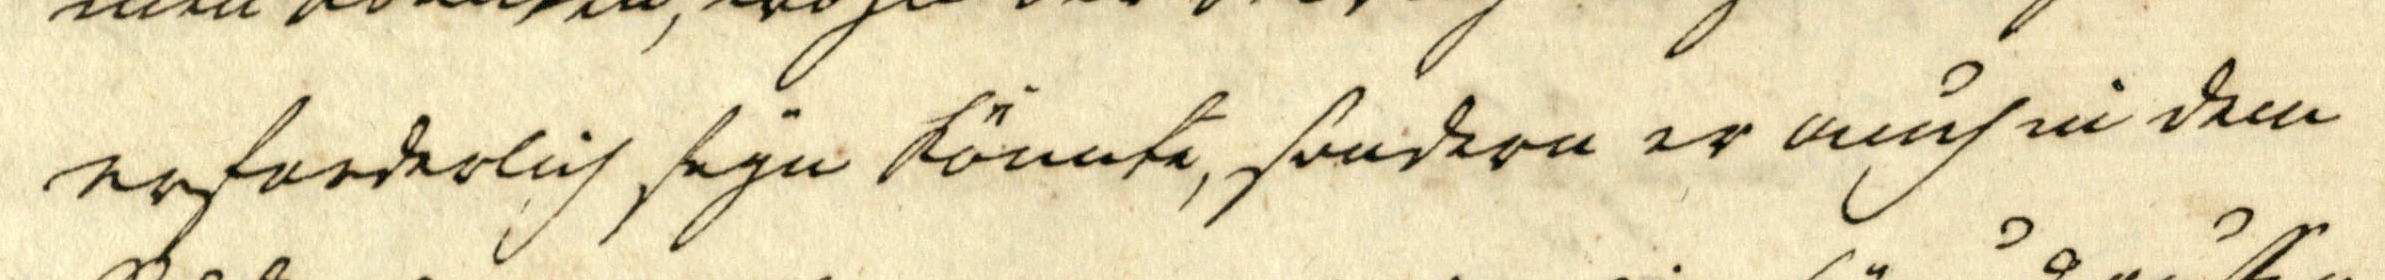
erforderlich seÿn könnte, sondern er auch in dem
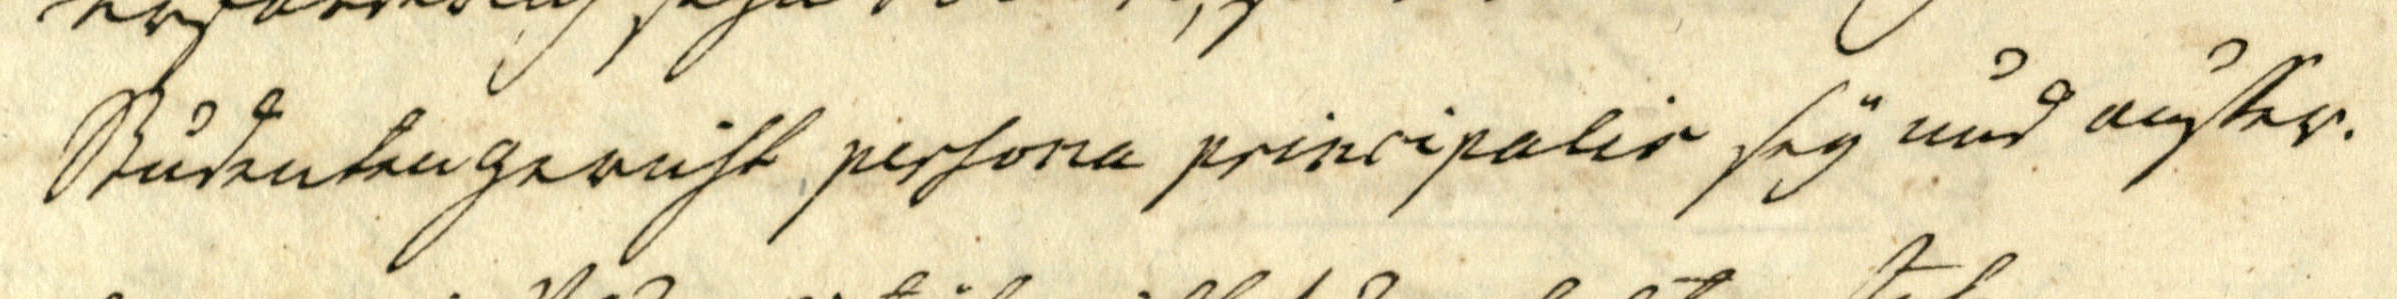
Studentengericht persona principalis seÿ und ausser¬
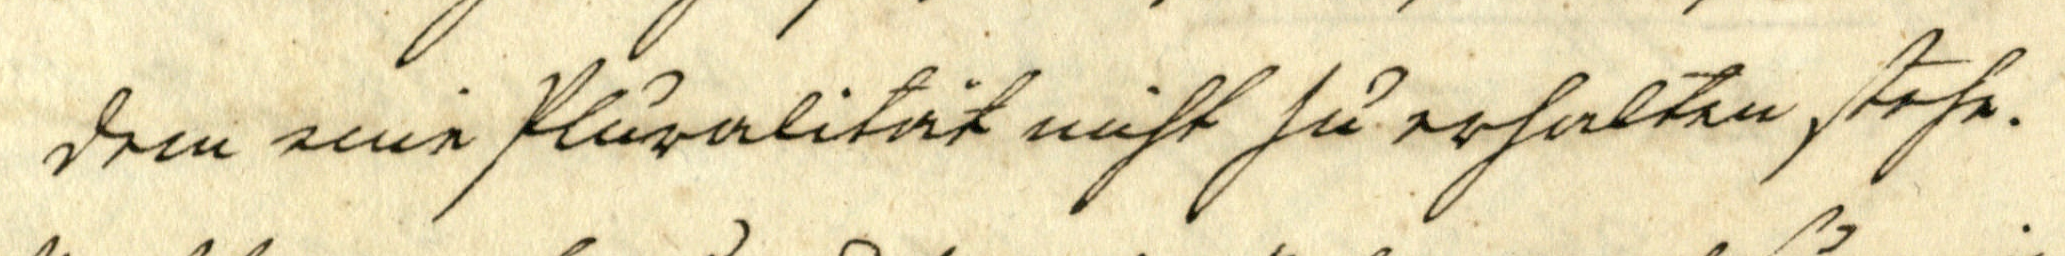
dem eine Pluralität nicht zu erhalten stehe.
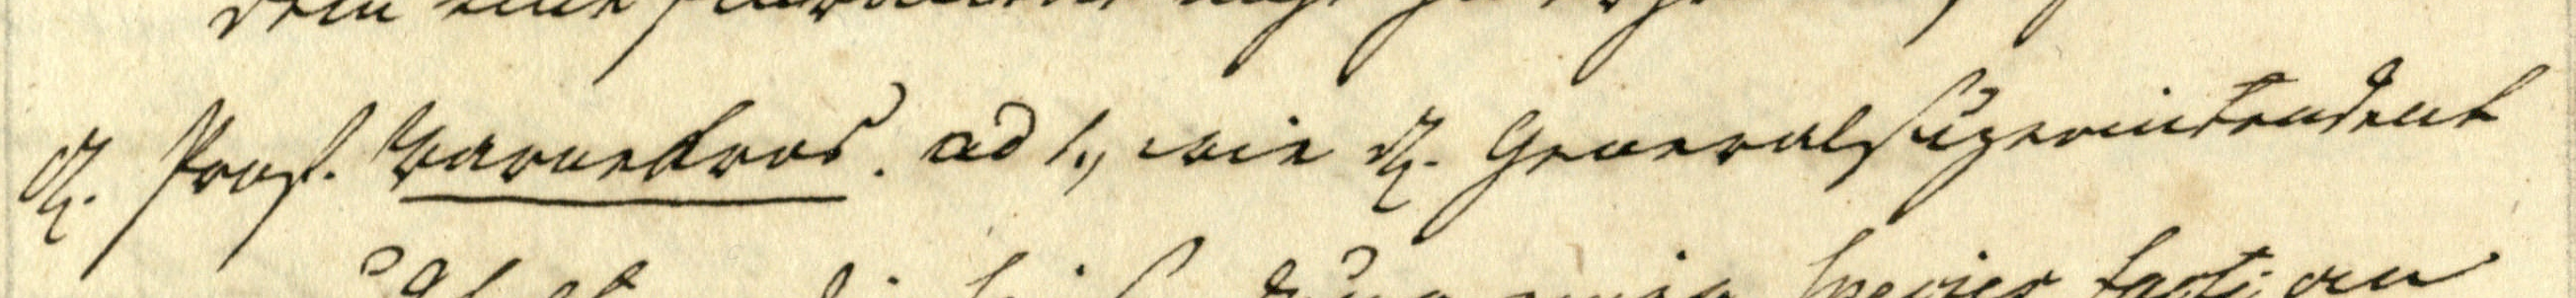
dh. Prof. Warnekros, ad 1., wie dh. Generalsuperintendent
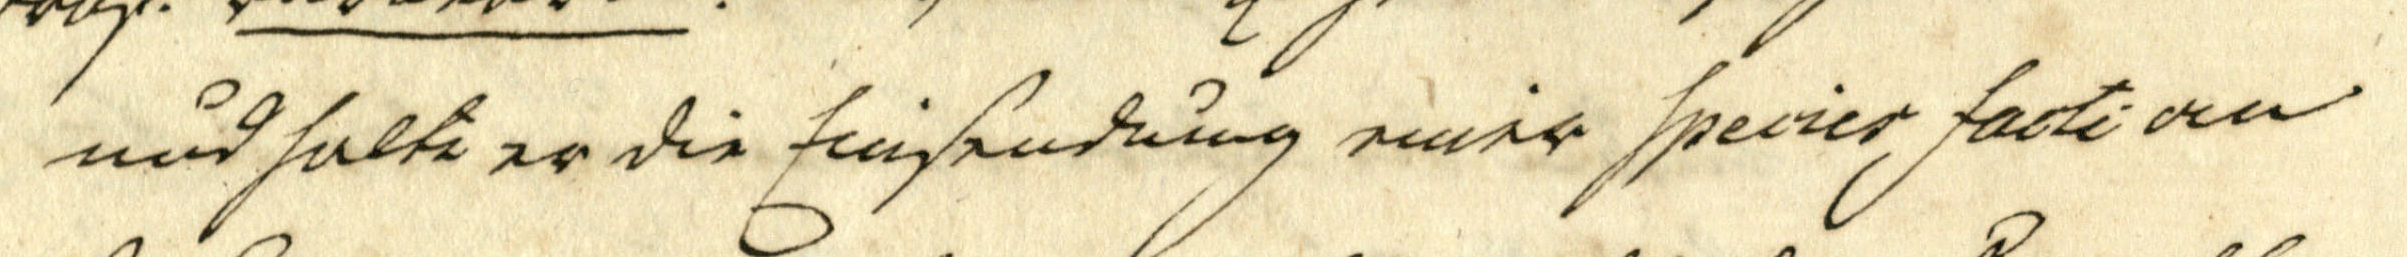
und halte er die Einsendung einer Species Facti an
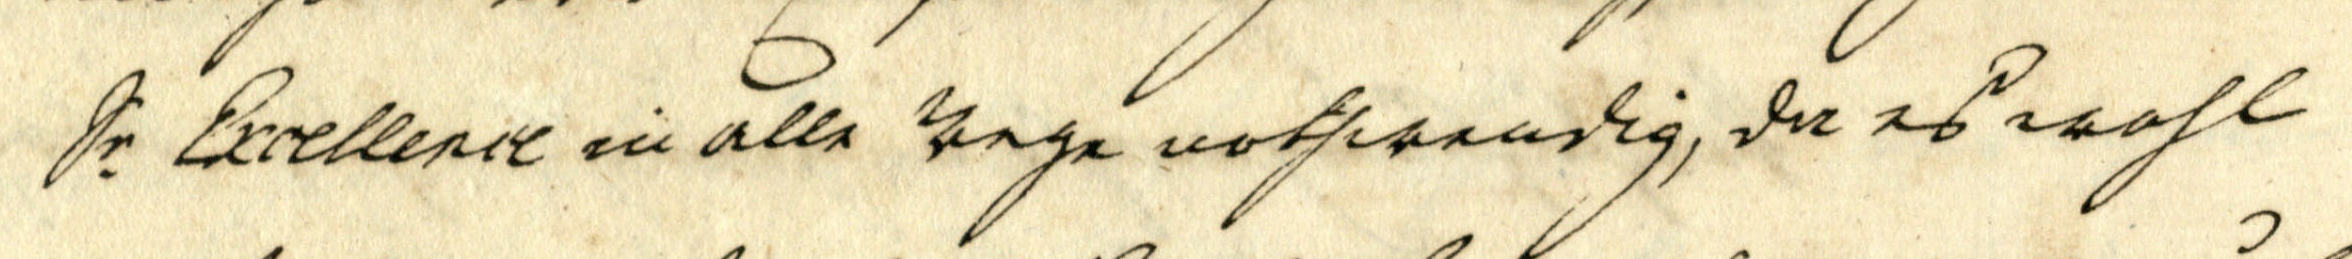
Sr Excellence in alle Wege nothwendig, da es wohl
